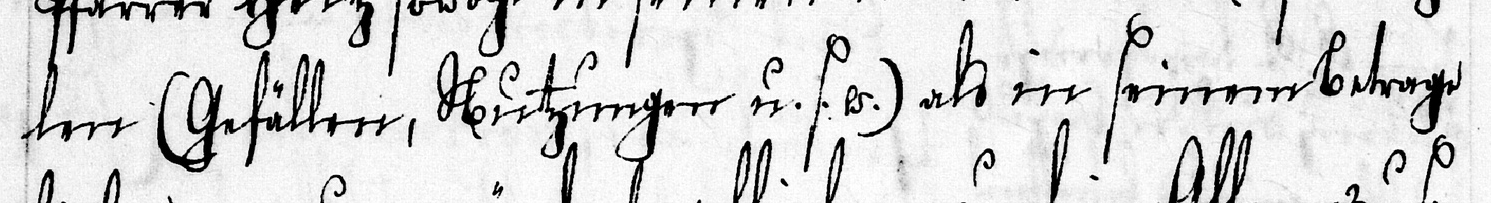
len (Gefällen, Nutzungen u. s. w.) als in seinem Betrage
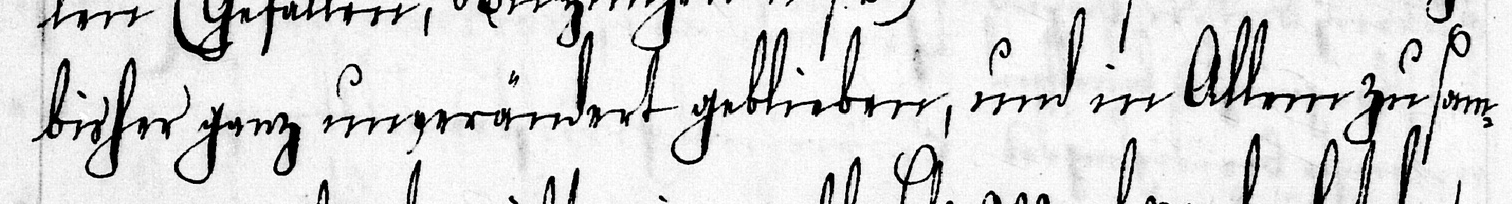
bisher ganz unverändert geblieben, und in Allem zusam¬
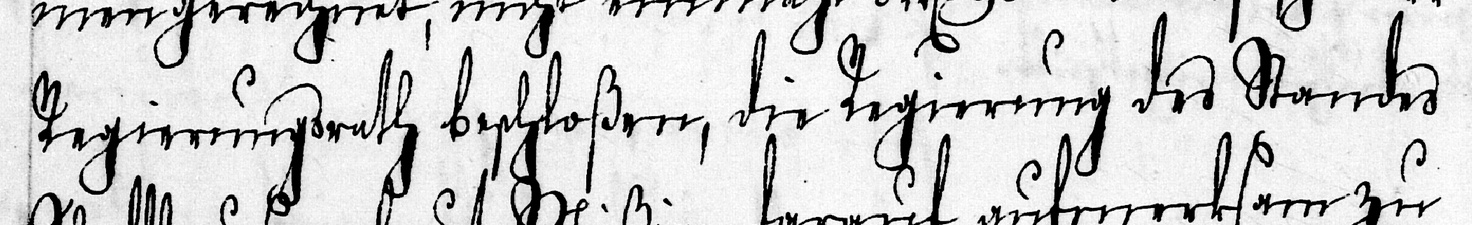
Regierungsrath beschloßen, die Regierung des Standes
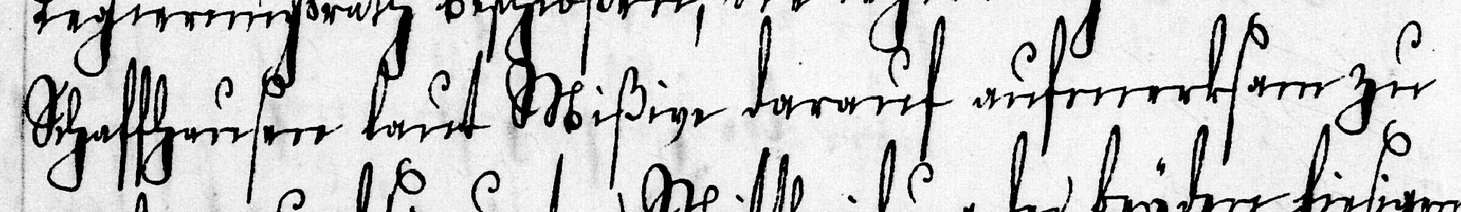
Schaffhausen laut Mißive darauf aufmerksam zu
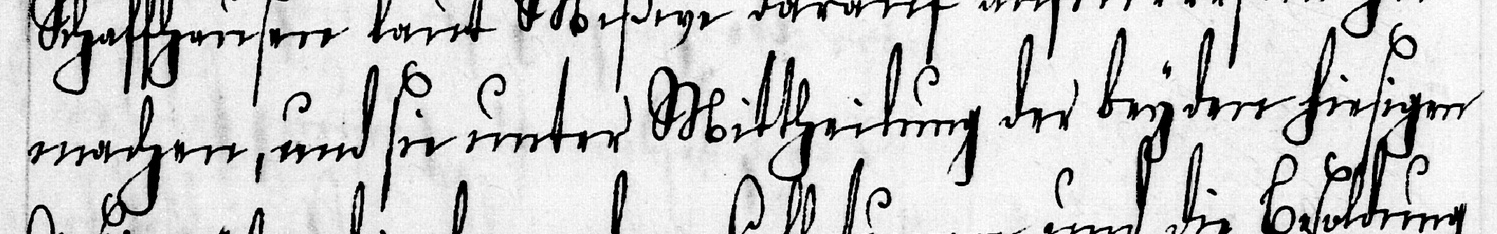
machen, und sie unter Mittheilung der beyden hiesigen
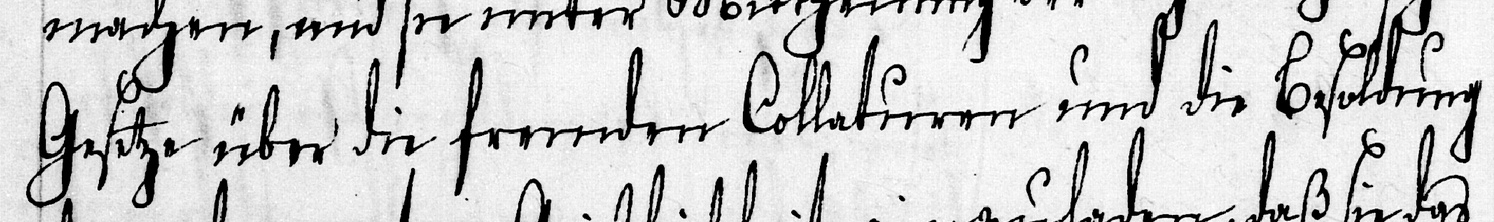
Gesetze über die fremden Collaturen und die Besoldung
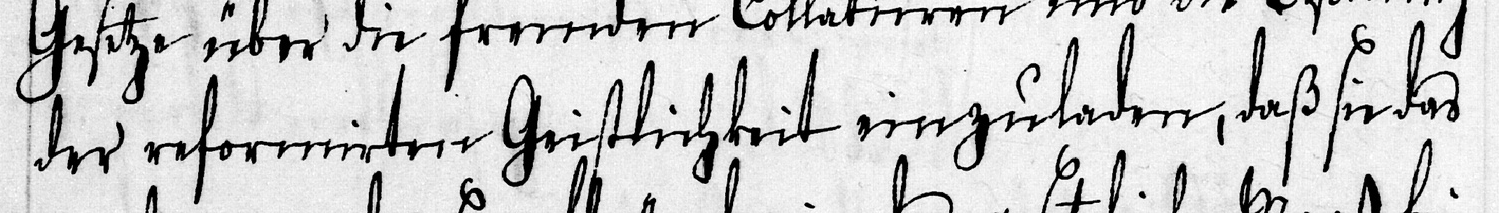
der reformirten Geistlichkeit einzuladen, daß sie das
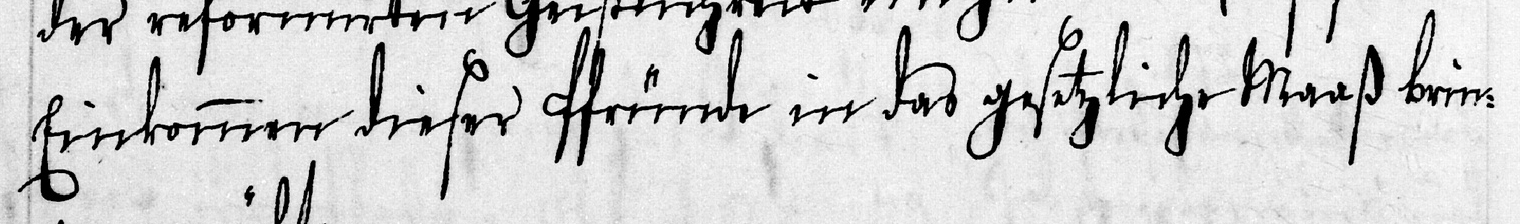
Einkommen dieser Pfründe in das gesetzliche Maaß brin¬
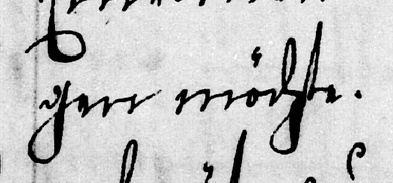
gen möchte.
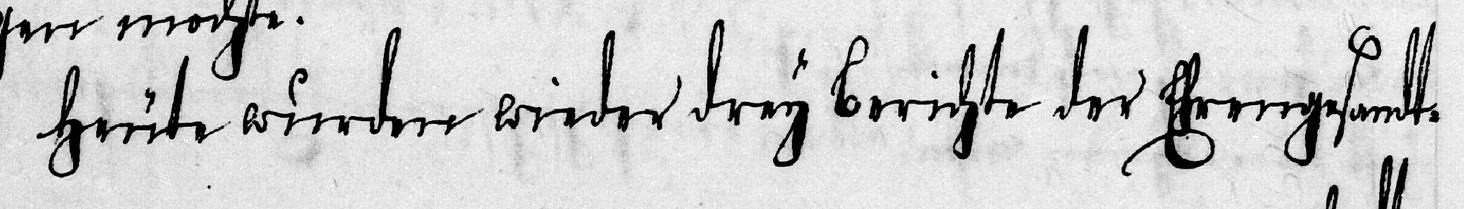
Heute wurden wieder drey Berichte der Ehrengesand¬
